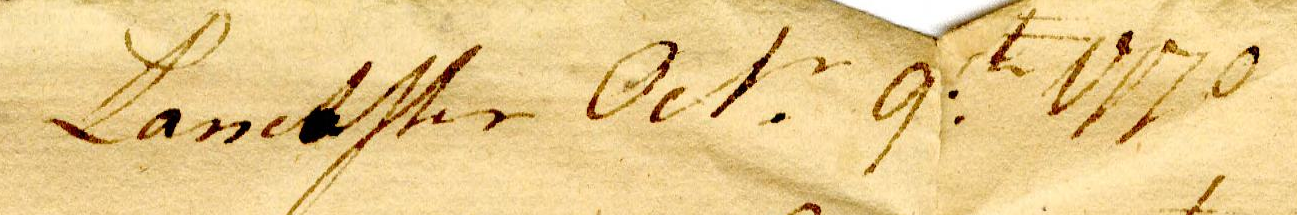Lanc[_]ster Oct^r. 9:^th 1770
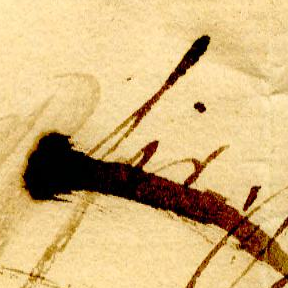Sir,
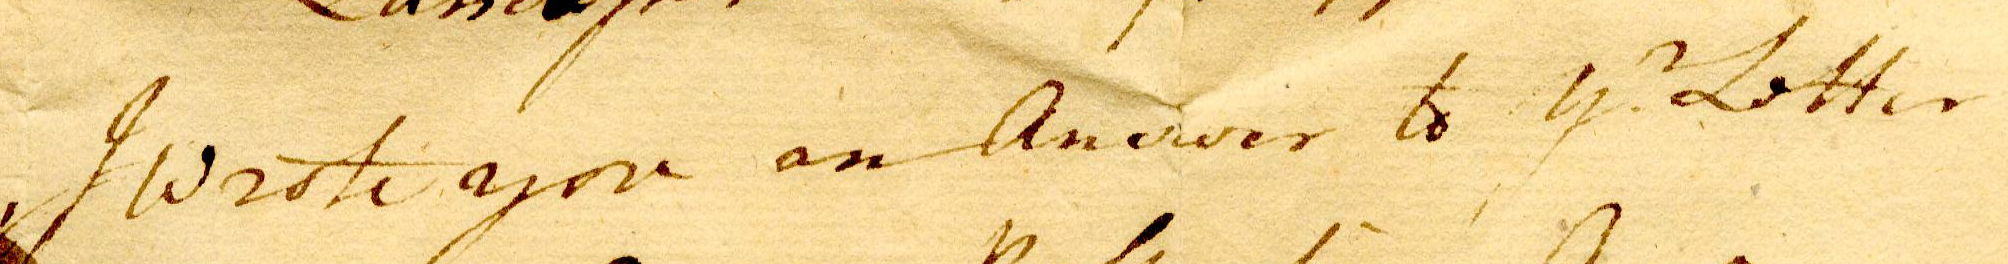I wrote you an Answer to y^r. Letter
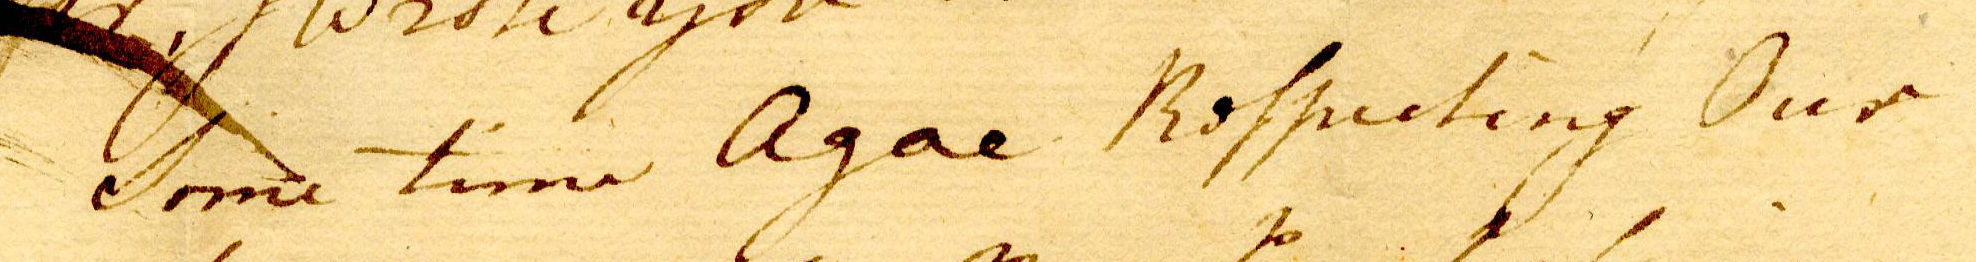some time Agoe Respecting Our
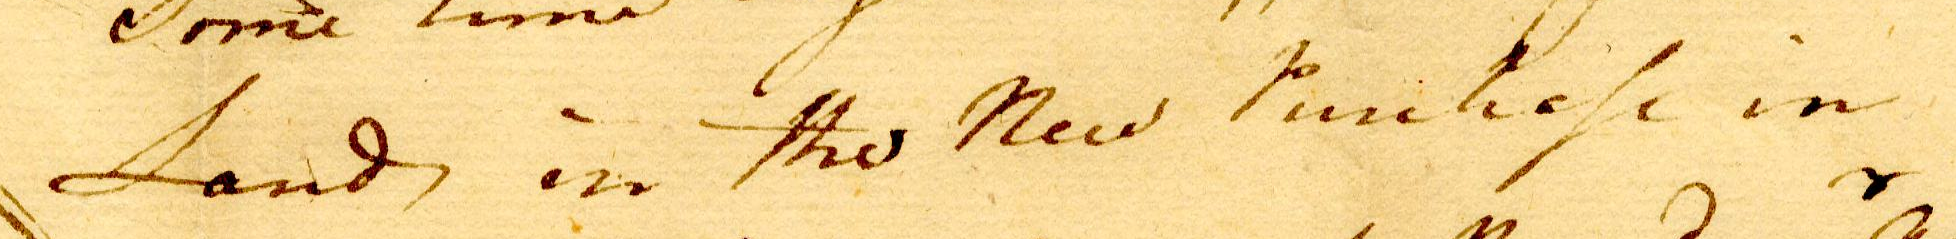Land in the new purchase in
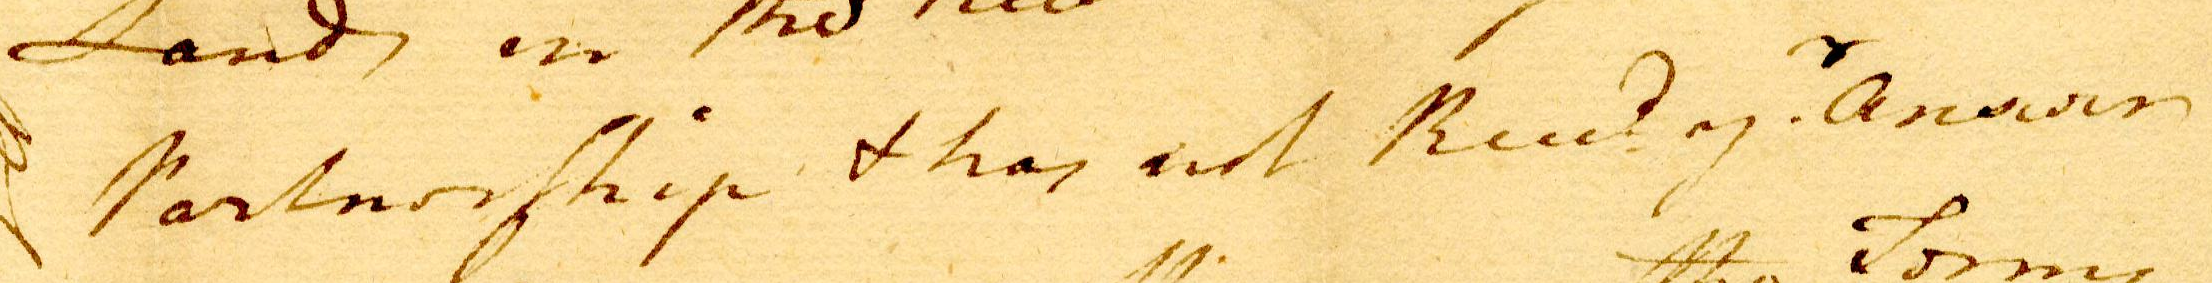Partnership & has not Rece^d y^r. Answer
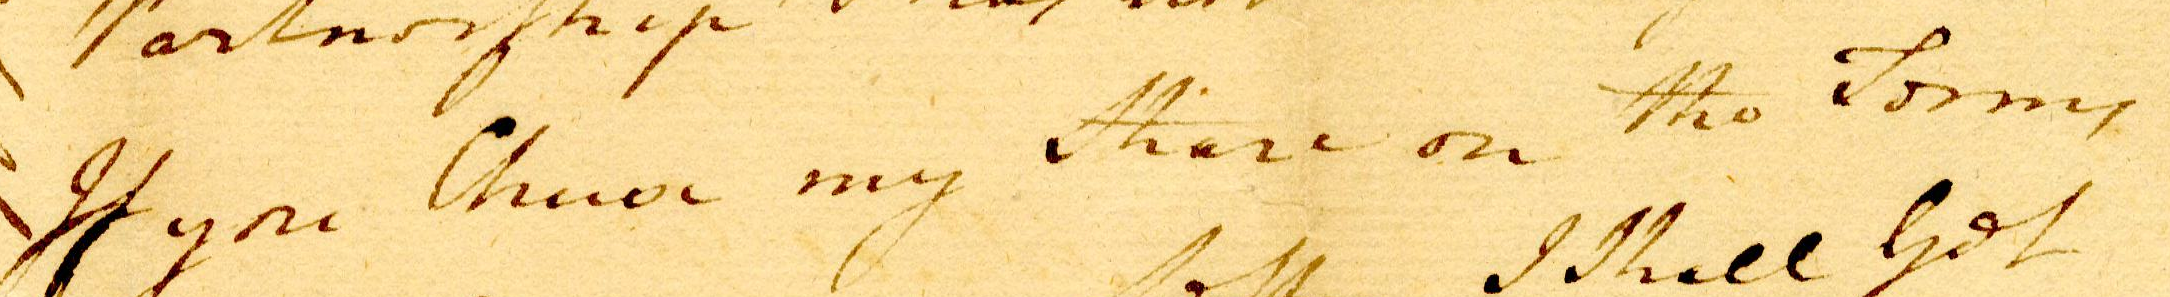If you Chuse my Share on the Terms
